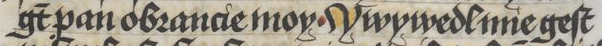ḡt pan obrancie moy.Ywywedl mie geſt
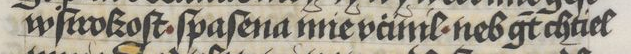wẛirokoſt.ſpaſena mie uċinil.neb ḡt chtiel
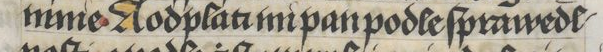mnie.A odplati mi pan podle ſprawedl¬
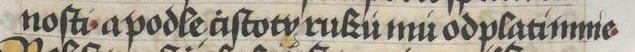noſti.a podle toty rukú mú odplatí mnie.
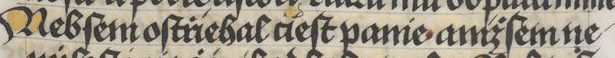Neb ſem oſtṙíehal cieſt panie.aniżſem ne¬
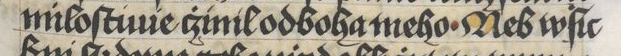miloſtivie cżinil odboha meho.Neb wẛic¬
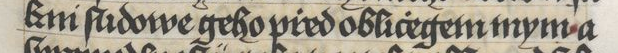kni ſudowe geho pṙed obliċegem mym.a
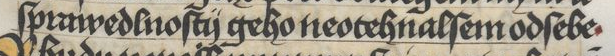ſprawedlnoſtij geho neotehnalſem odſebe.
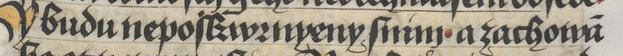Y budu nepoẛkwrnyeny ſním.a zachowā
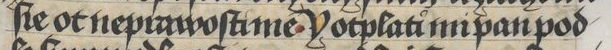ſie ot neprawoſti mé.Y otplati mi pan pod¬
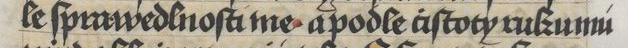le ſprawedlnoſti me.a podle ċiſtoty ruku mú
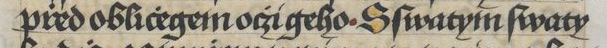pṙed obliċegem ocżi geho.Sſwatym ſwaty
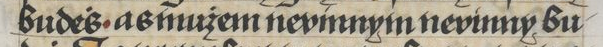budeṡ.a s mużem nevinnym nevinny bu¬
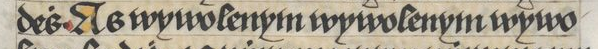deṡ.A s wywolenym wywolenym wywo¬
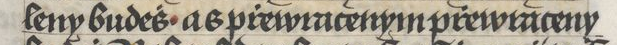leny budeṡ.a s pṙewracenym pṙewraceny
